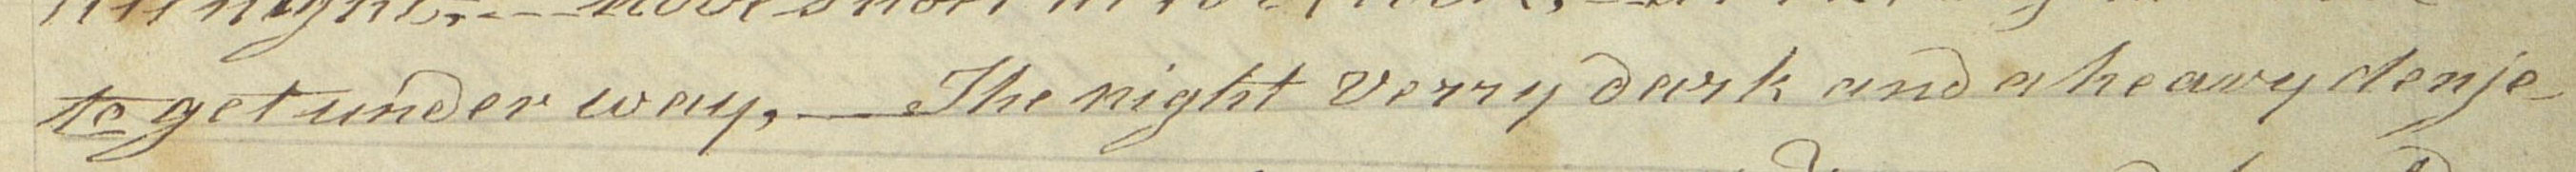to get under way, The night Verry dark and a heavy dense
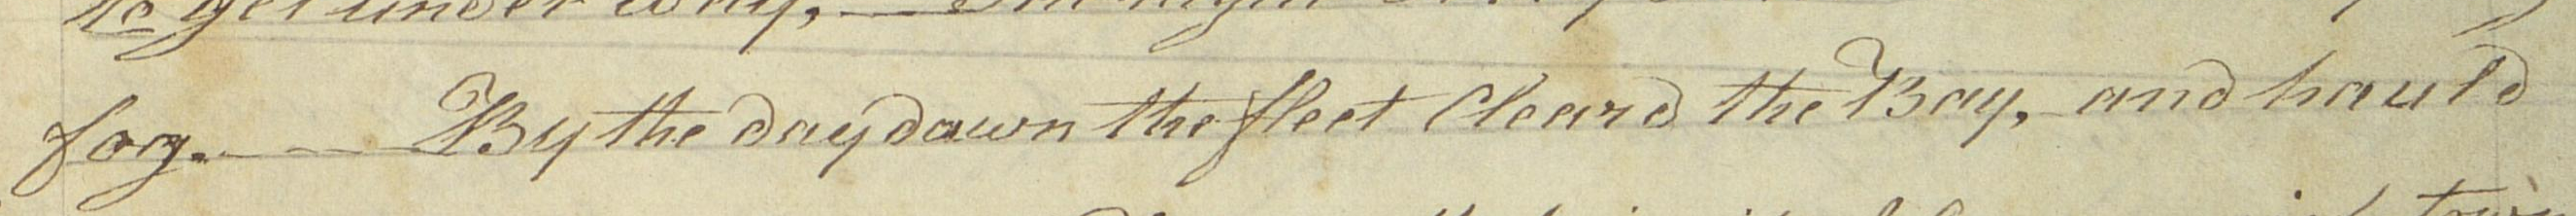fog. By the daydawn the fleet Cleard the Bay, and haul'd
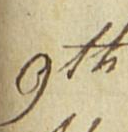9^th
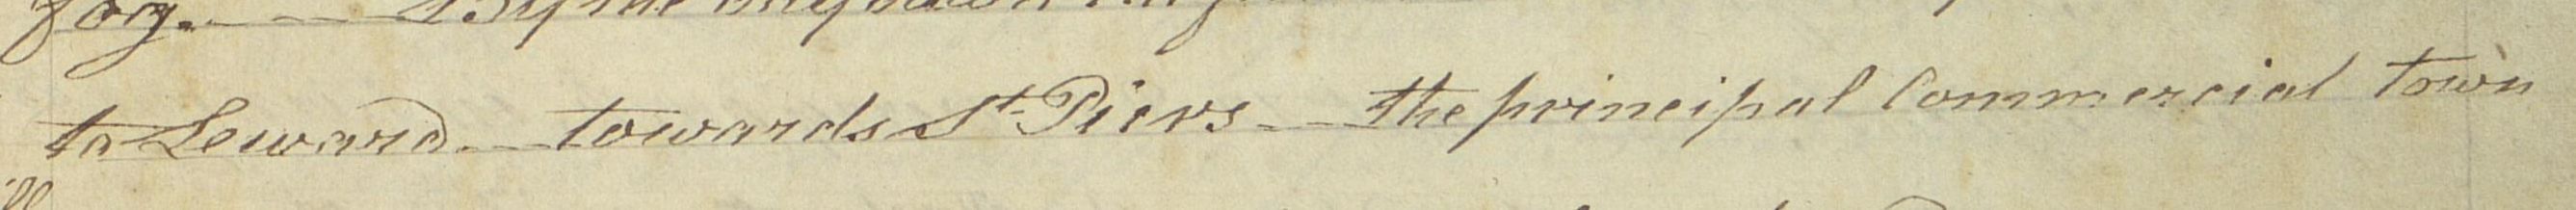to Leward towards S^t Piers the principal Commercial town
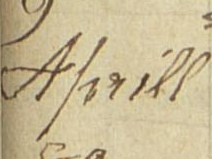Aprill
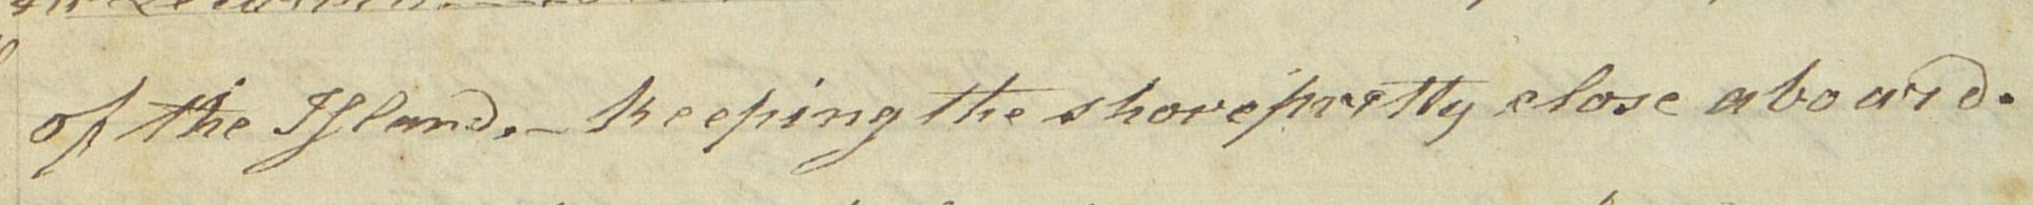of the Island. Keeping the shore pretty close aboard.
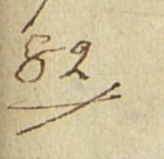82
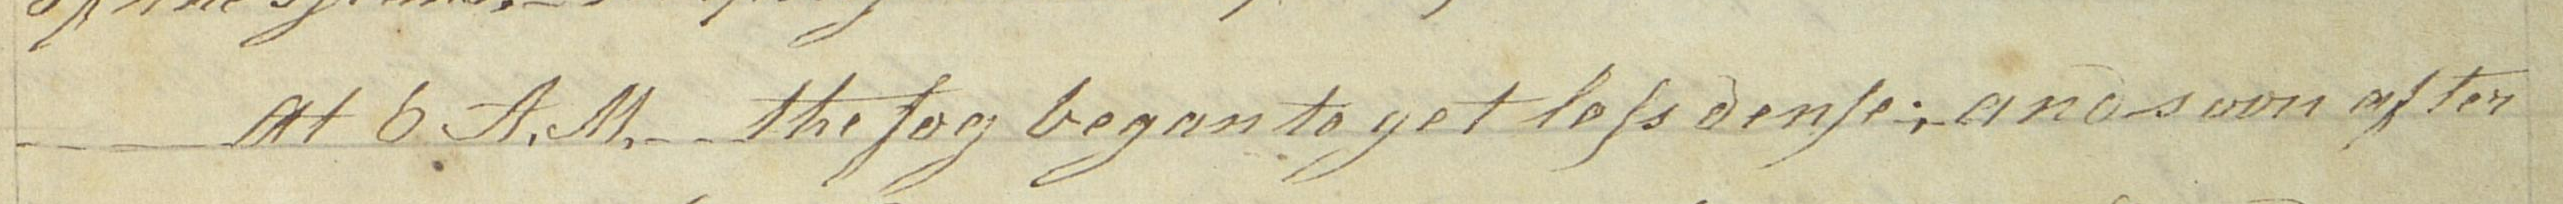At 6 A.M. the fog began to get less dense; and soon after
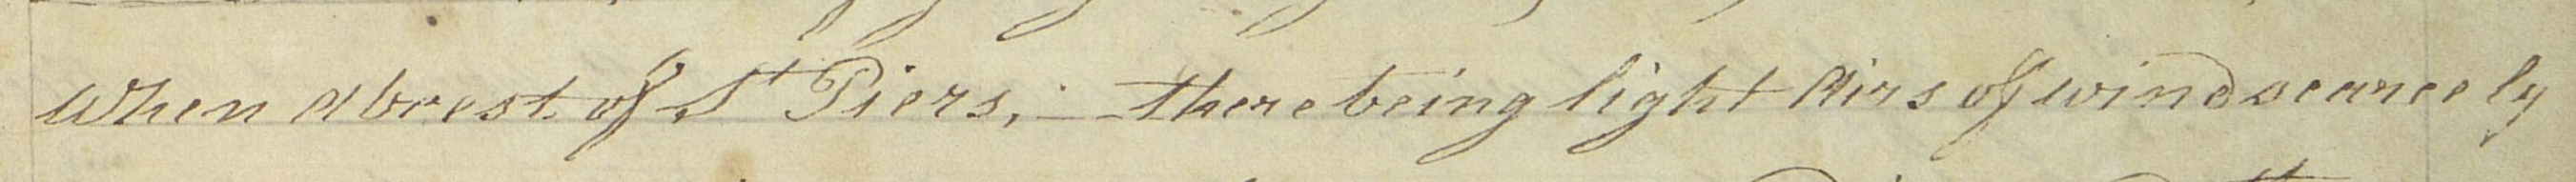When abrest of S^t Piers, there being light Airs of wind scarcely
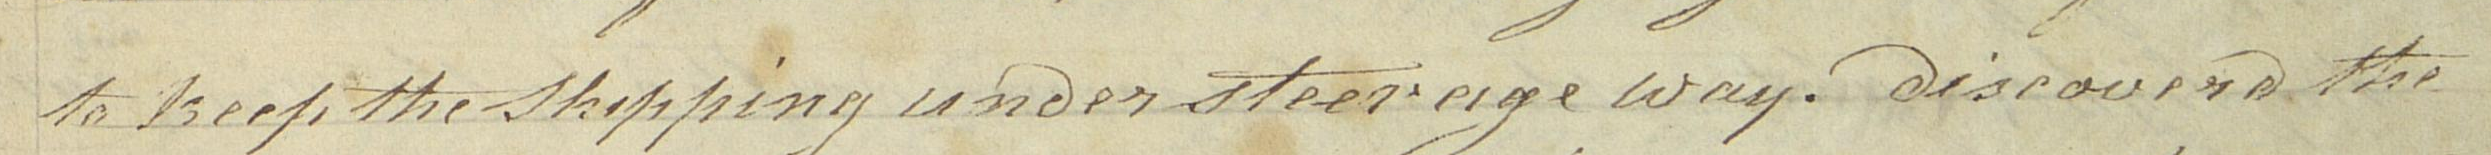to keep the Shipping under steerage way. discoverd the
